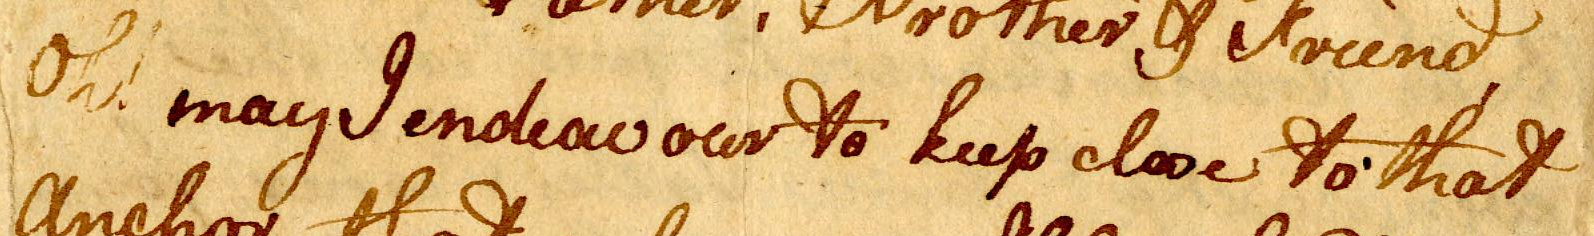Oh may I endeavor to keep close to that
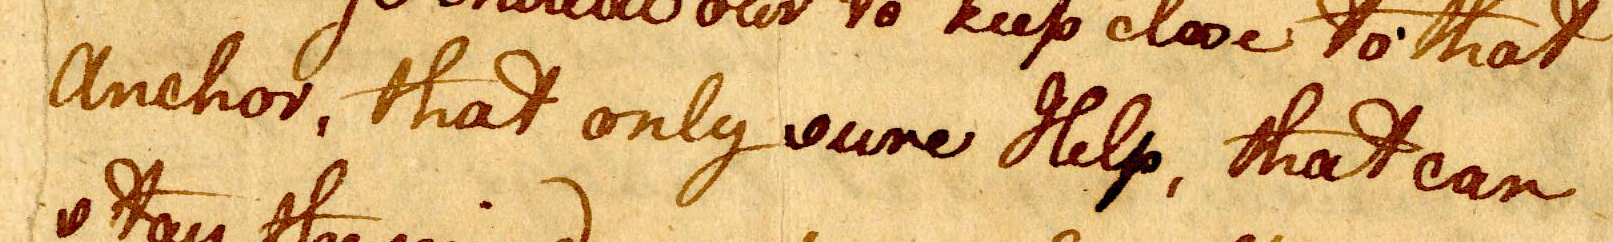Anchor, that only sure Help, that can
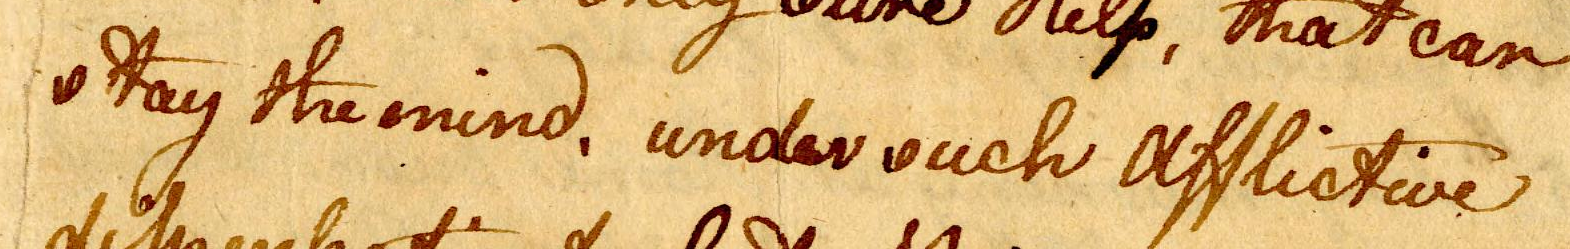stay the mind, under such Afflictive
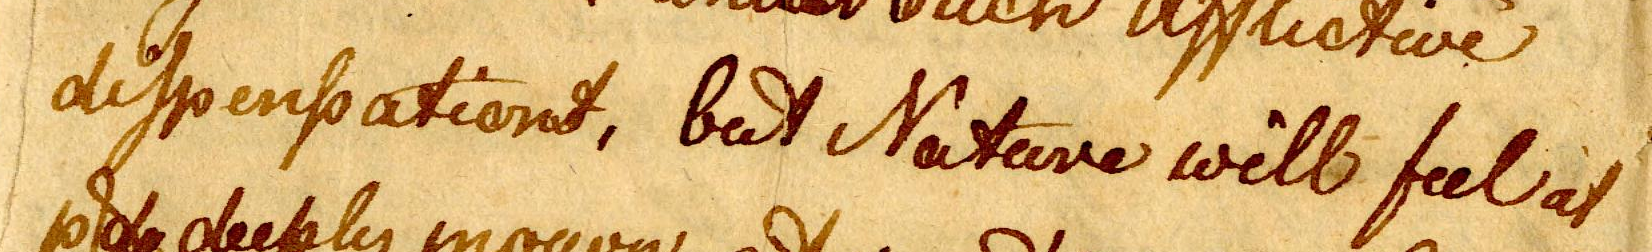dispenssationst, but Nature will feel at
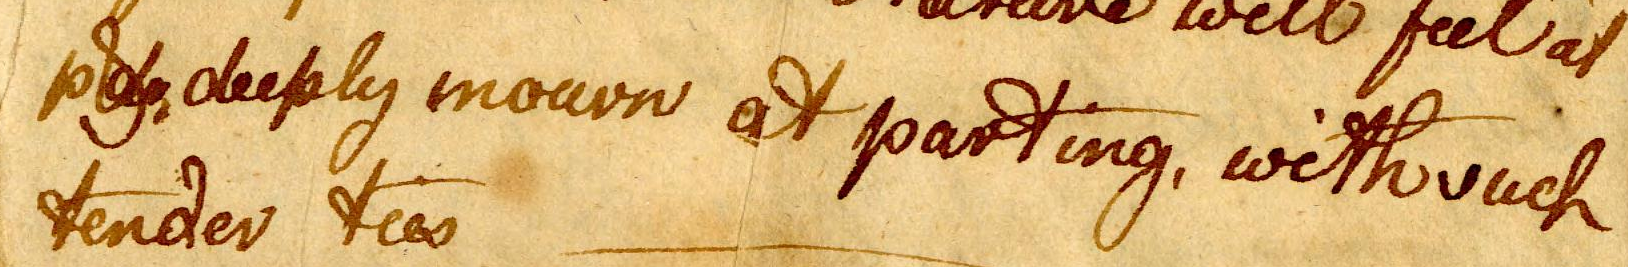p & deeply mourn at parting, with such
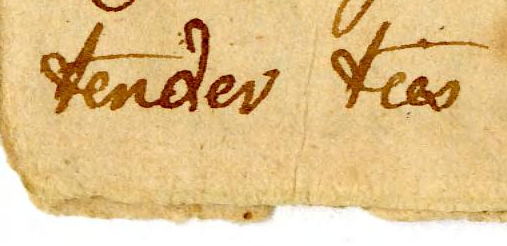tender teas -
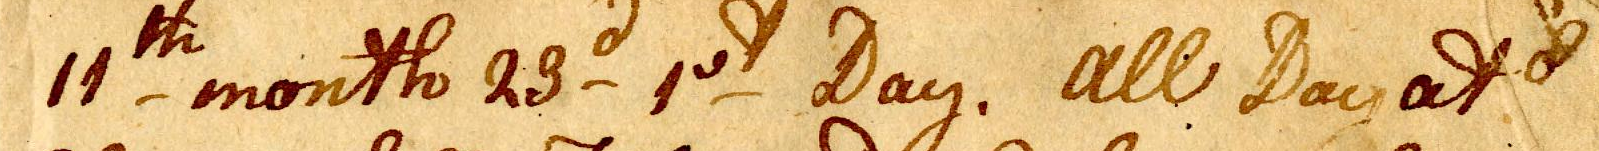11^th month 23^d 1^st Day. All Day at
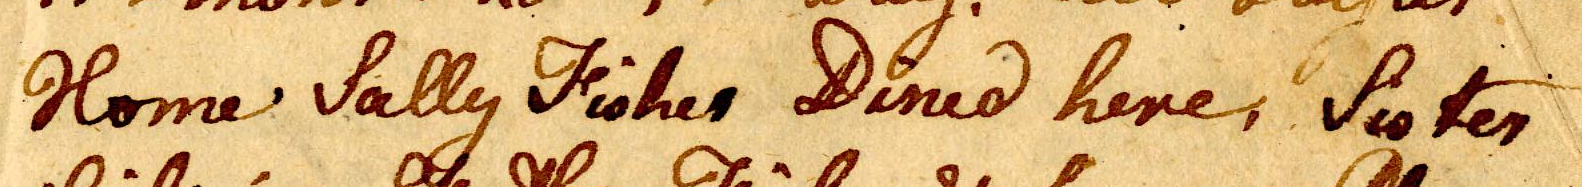Home Sally Fisher Dined here, Sister
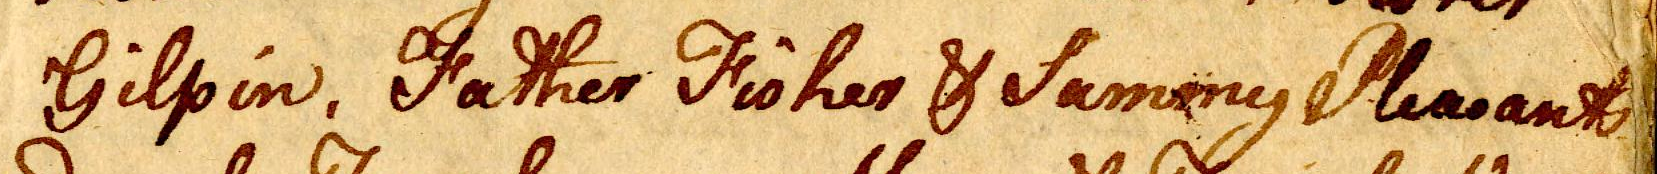Gilpin, Father Fisher & Sammy Pleasants
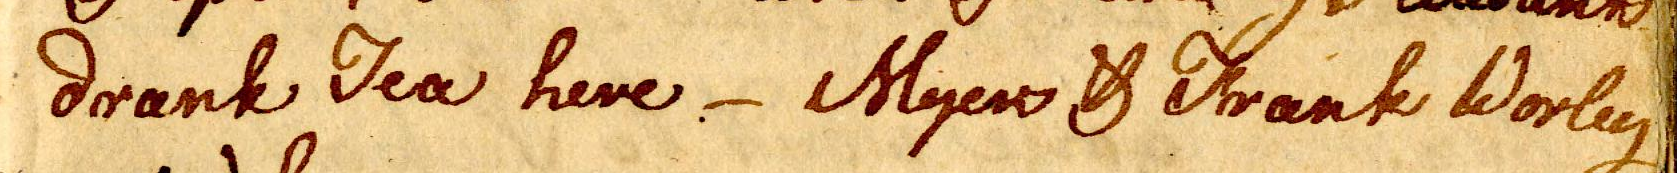drank Tea here.- Myers & Frank Worley
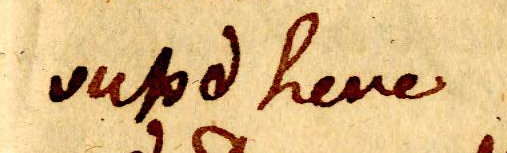supd here -
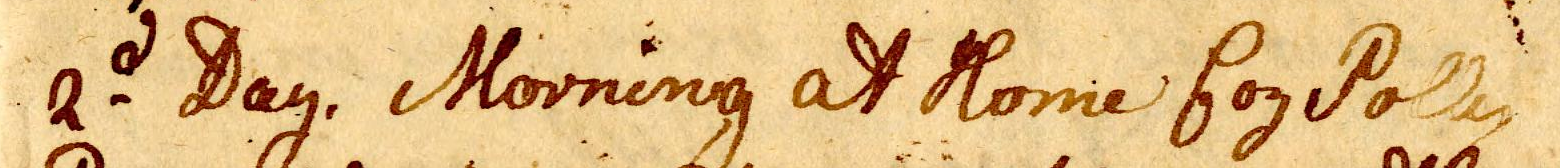2^d Day, Morning at Home Coz Polly
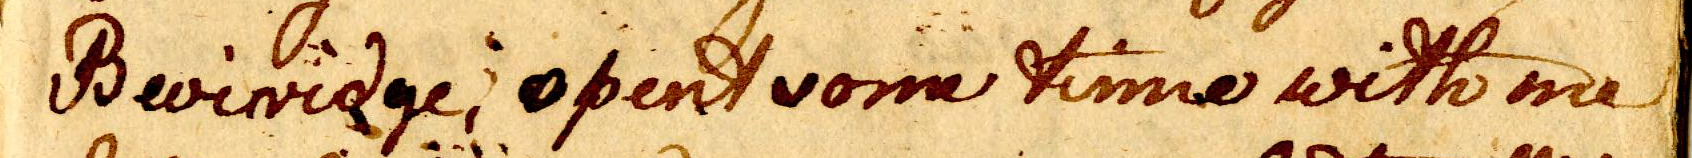Beviridge, spent some time with me
